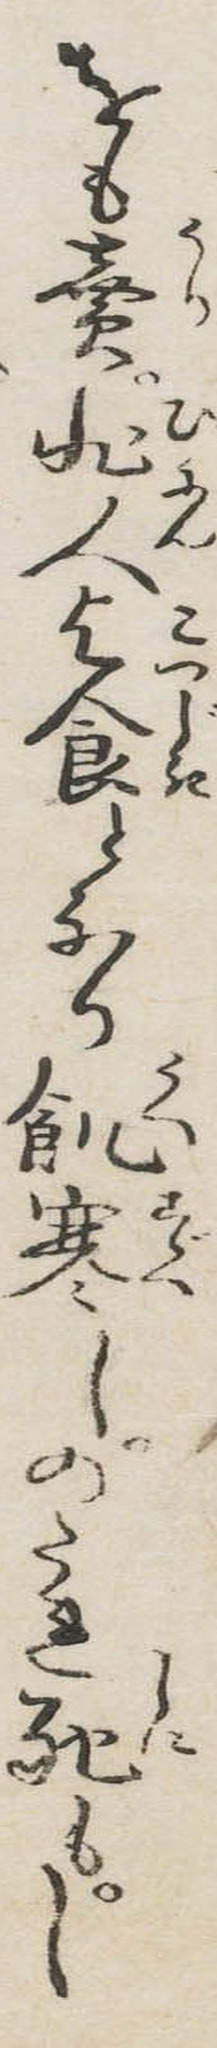をも売。非人乞食となり飢寒し。のたれ死も。し
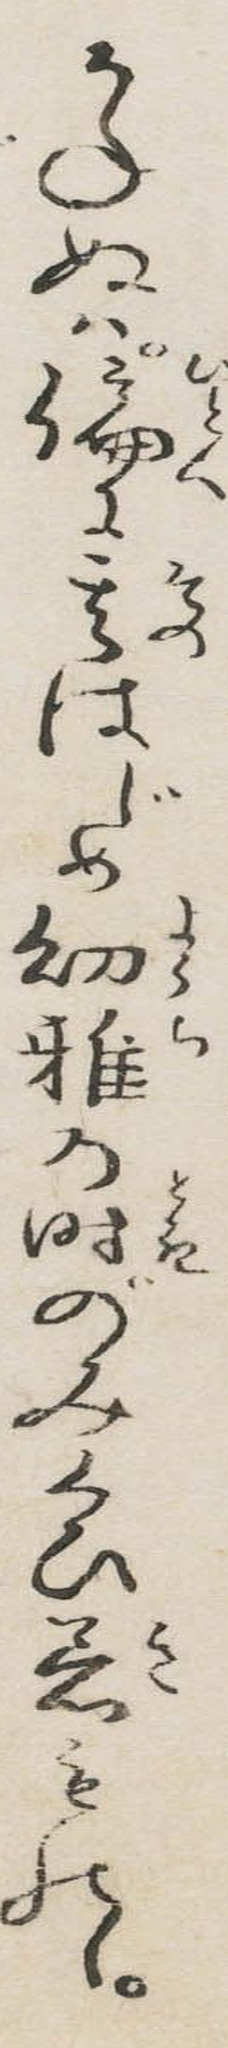かねぬは。偏に其はじめ幼稚の時。のみくひ着ものゝ。
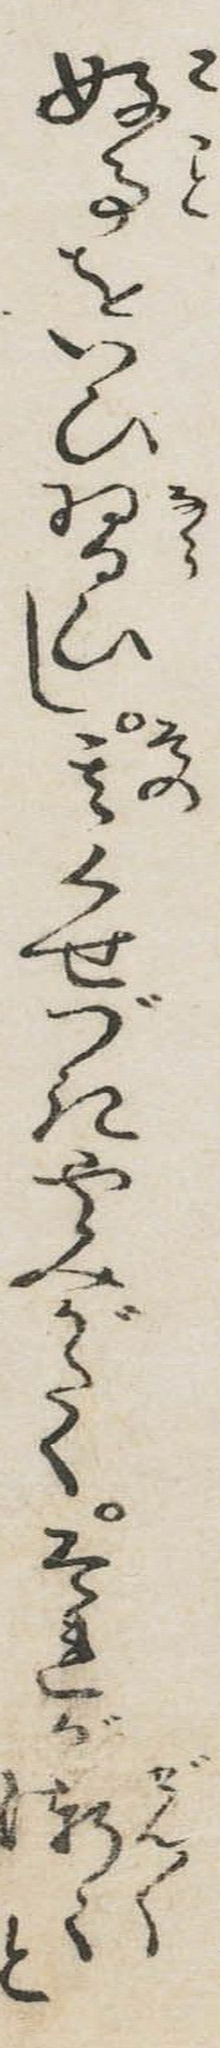好事をいひ習ひし。其くせづきやみがたく。それが漸々と
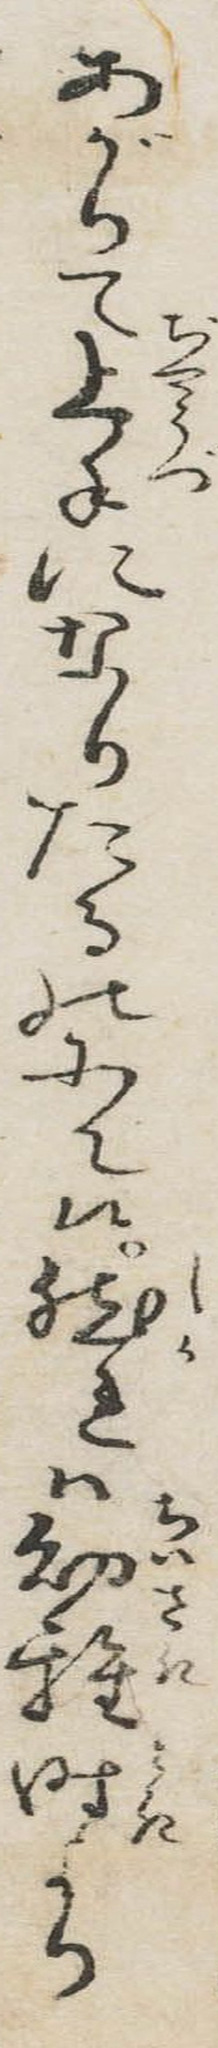あがりて上手になりたるのにて候。然れは幼稚時より
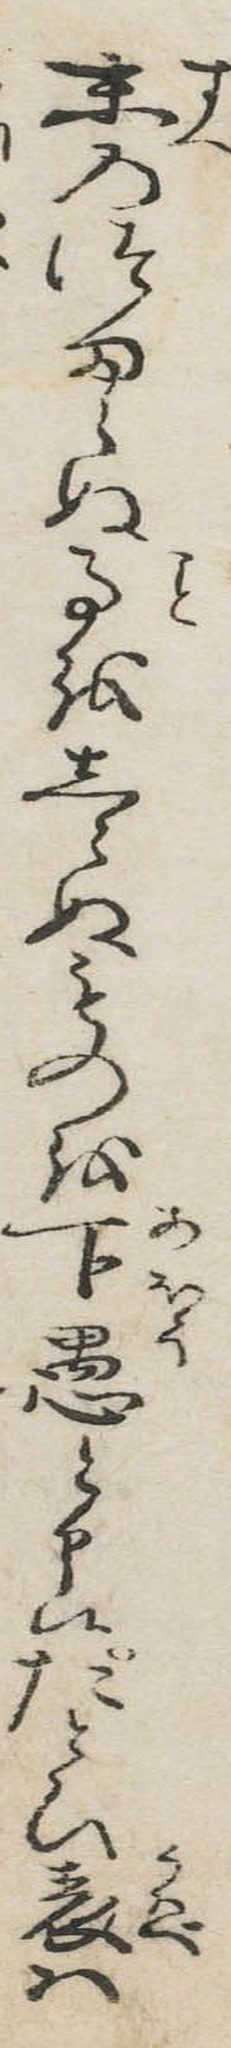末のつまらぬ事をしらぬものを下愚と申候。たとひ表は
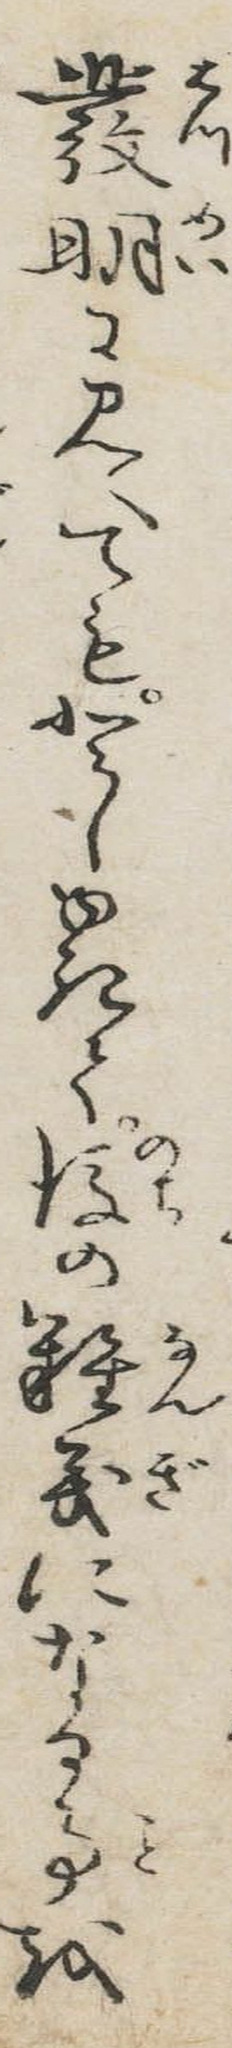発明に見へても。としゆきて。後の難義になる事を
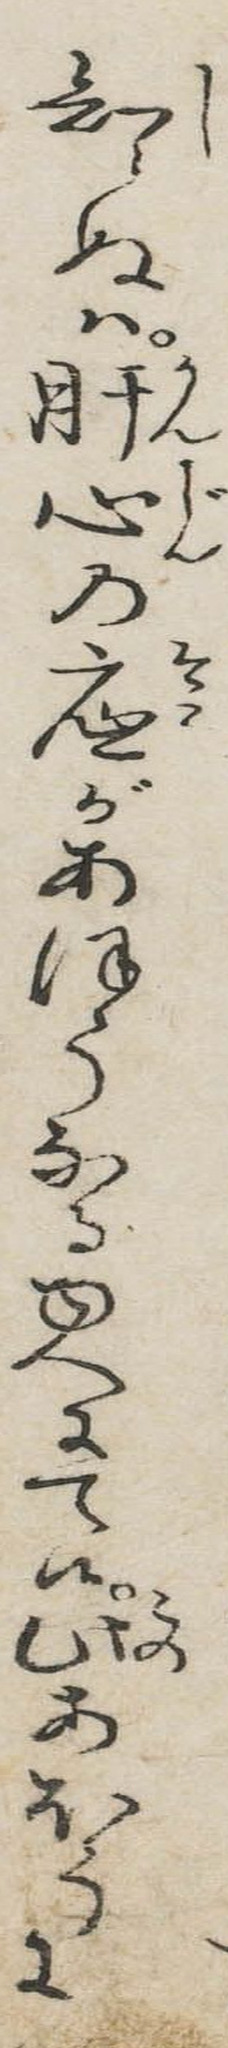知らぬは。肝心の底があほうなるゆへにて候。此あほうに
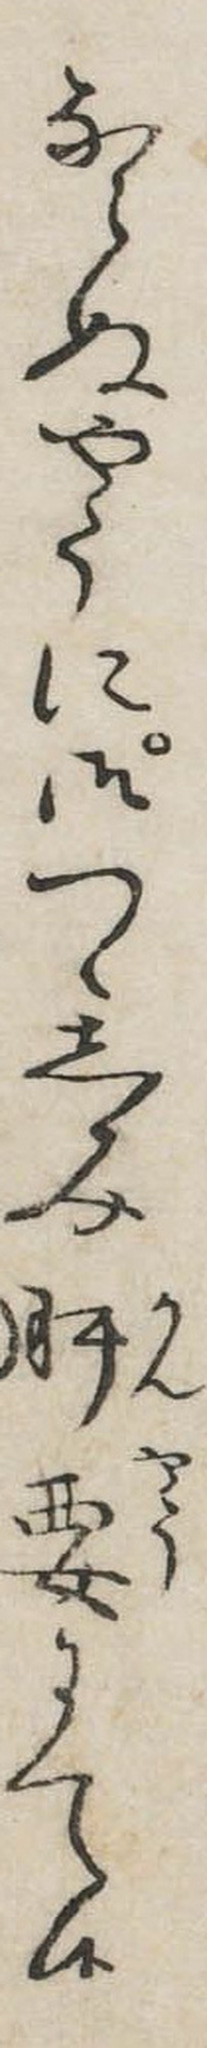ならぬやうに。つゝしみ肝要にて候
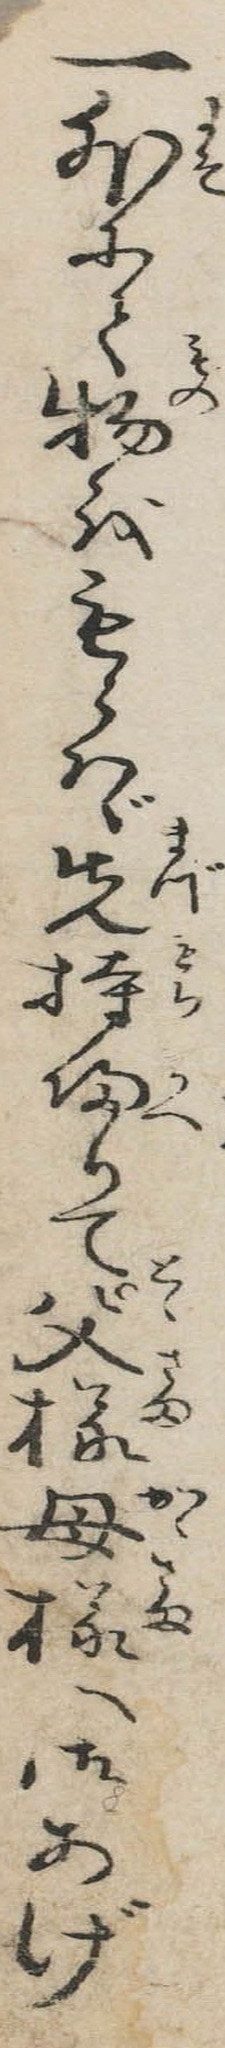一外にて物をもらはゞ先持帰りて。父様母様へ御あげ

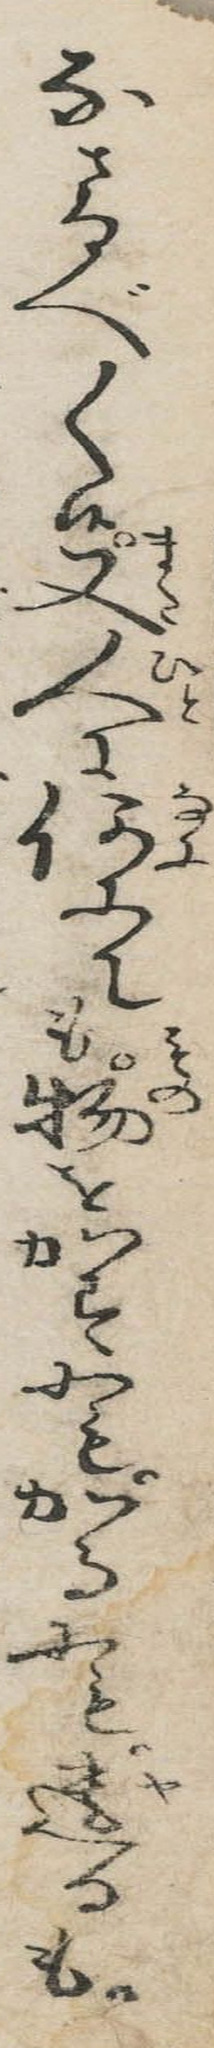ゝなさるべく候。又人に何にても。物をかすにも。かるにも。遣るも。
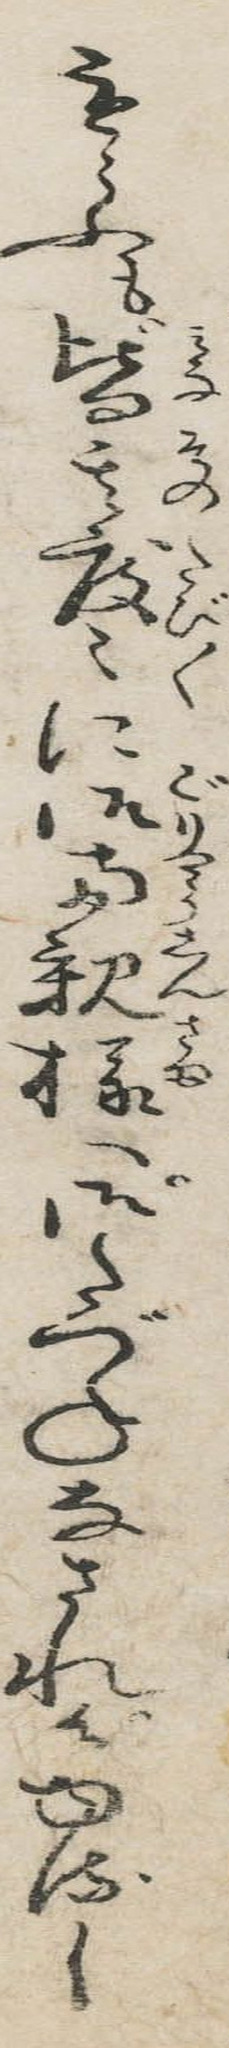もらふも。皆其度々に御両親様へ。御たづねなされ。御ゆるし
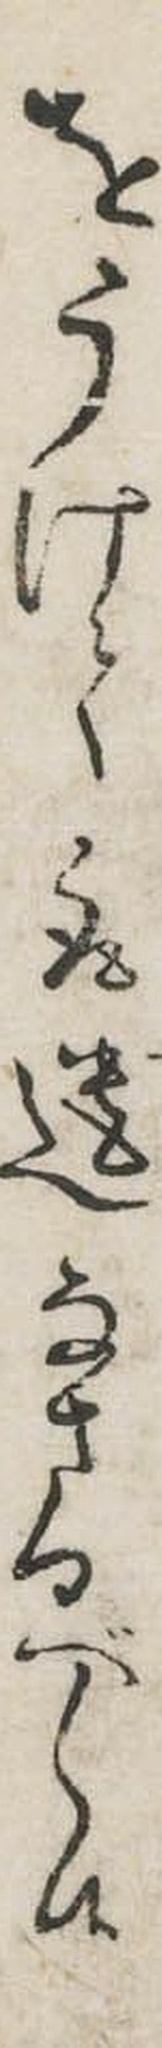をうけて取遣なさるべく候
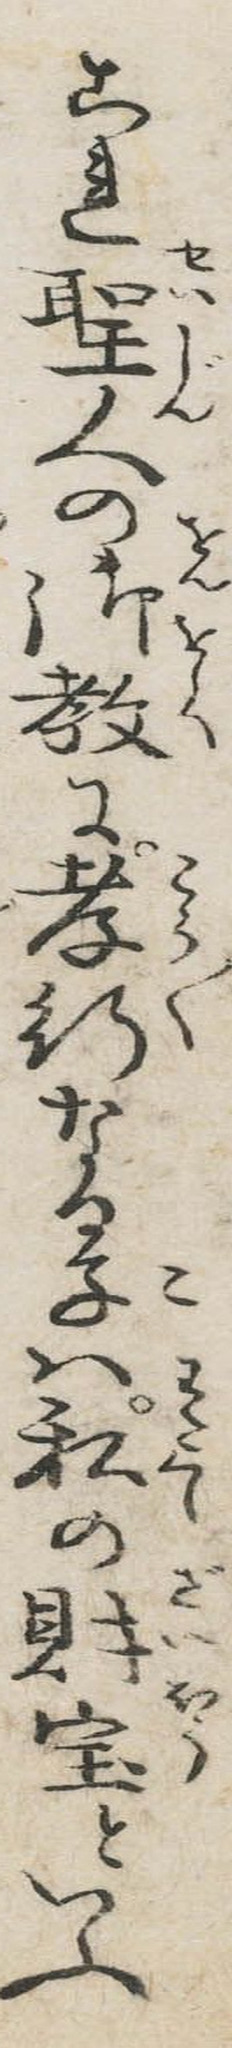これ聖人の御教に。孝行なる子は。私の財宝といふ
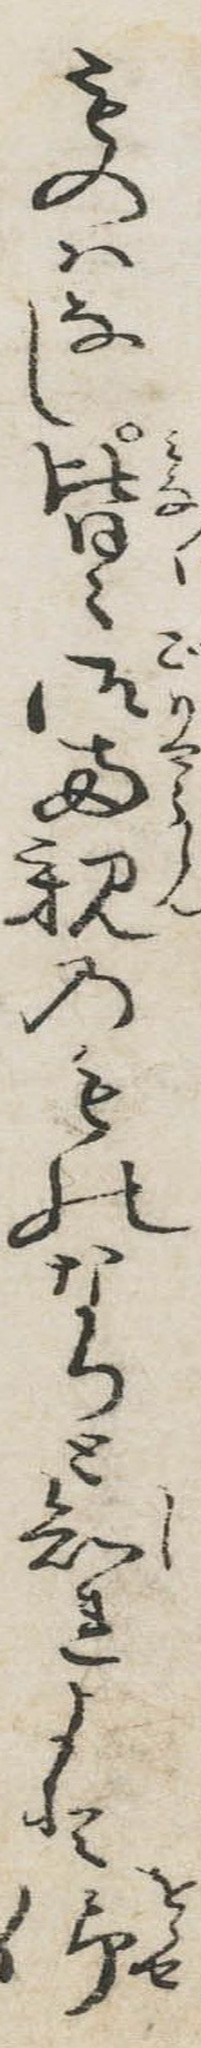ものはなし。皆々御両親のものなりと知れよと仰
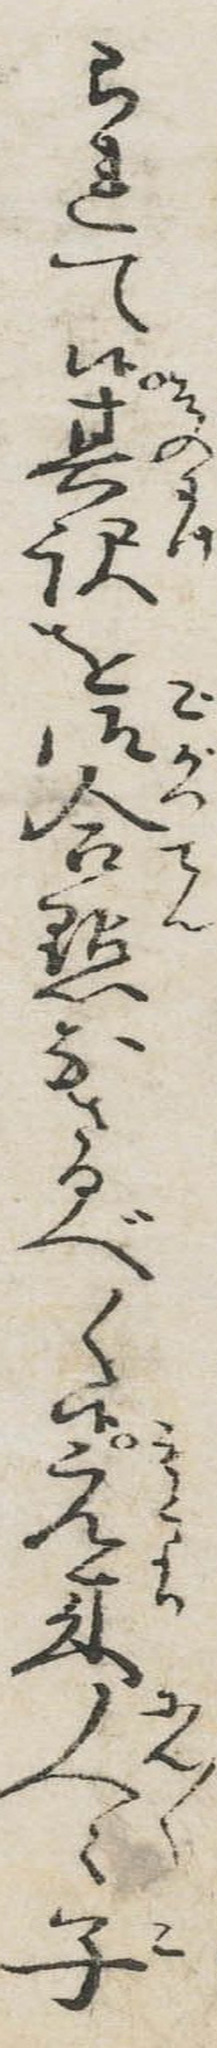られて候。其訳を御合点なさるべく候。元来人々子
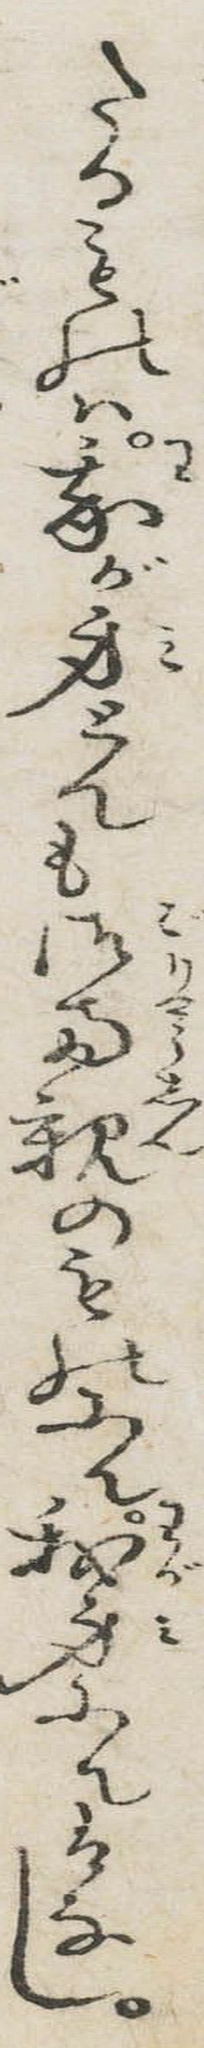たるものは。我が身とても御両親のものにて。我身にてはなし。
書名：前訓
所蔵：東京学芸大学附属図書館
